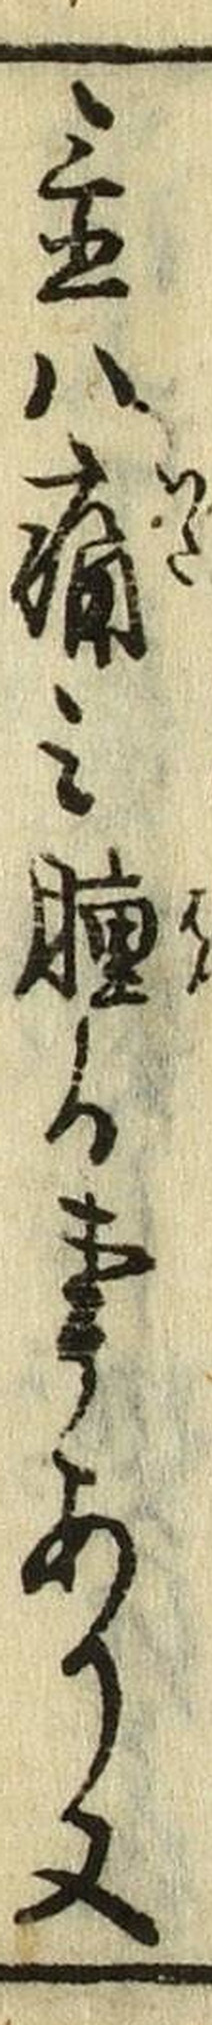置は痛み腫る事あり又
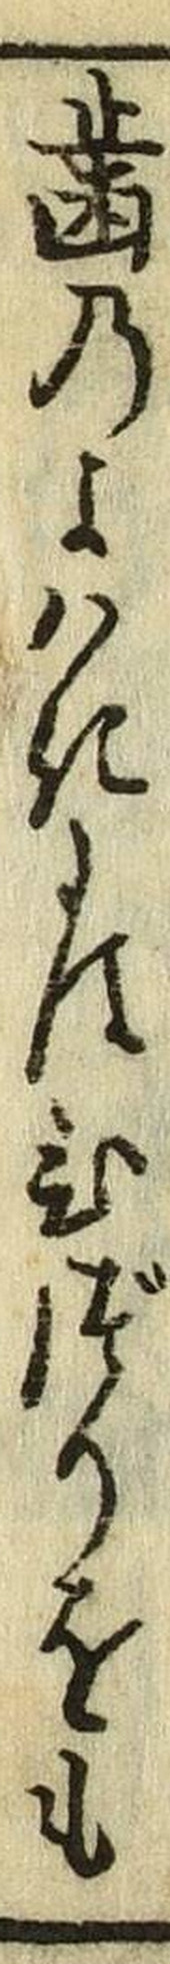歯のよはきにはひづりをも
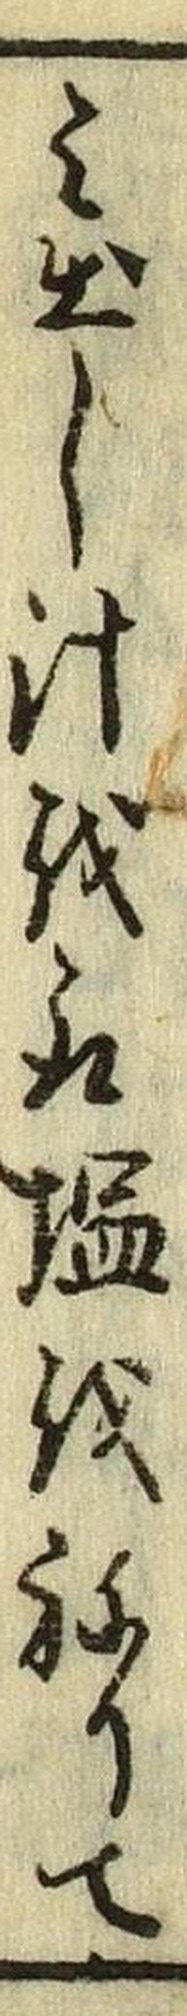み出し汁を取塩をねりて
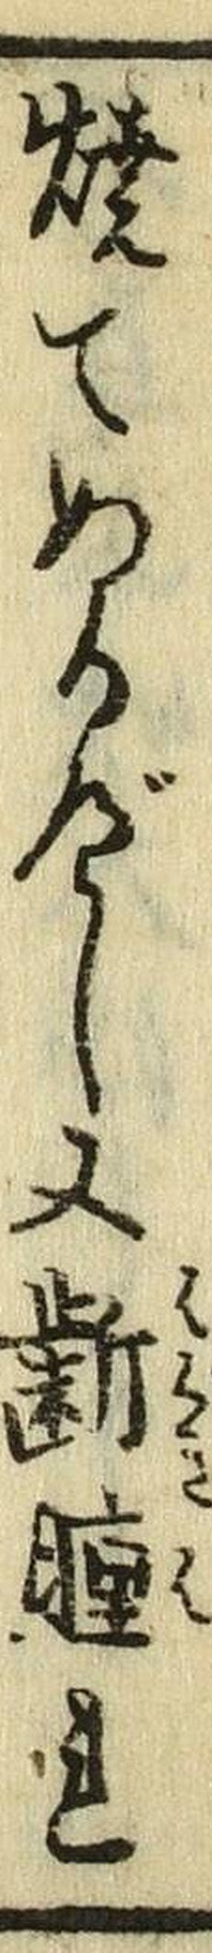焼てぬるべし又齦腫れ
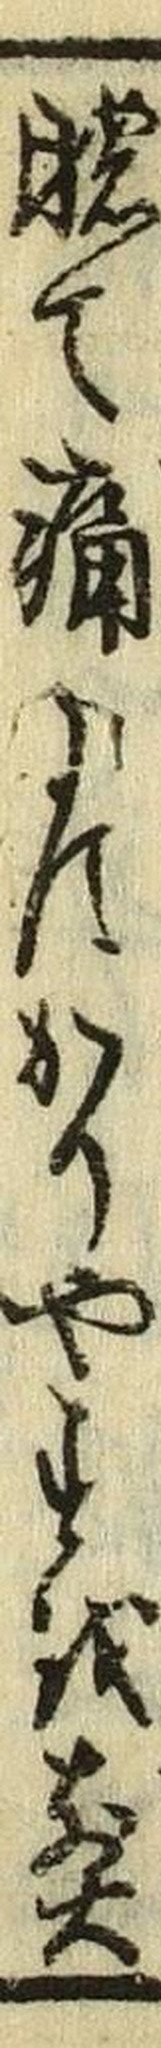膿て痛にはかりやすを煎
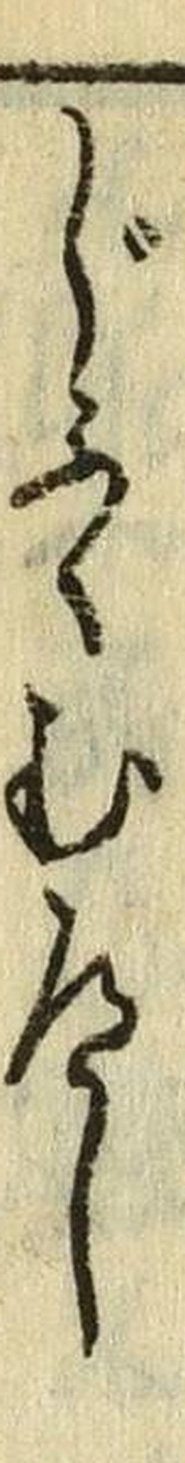じふくむへし
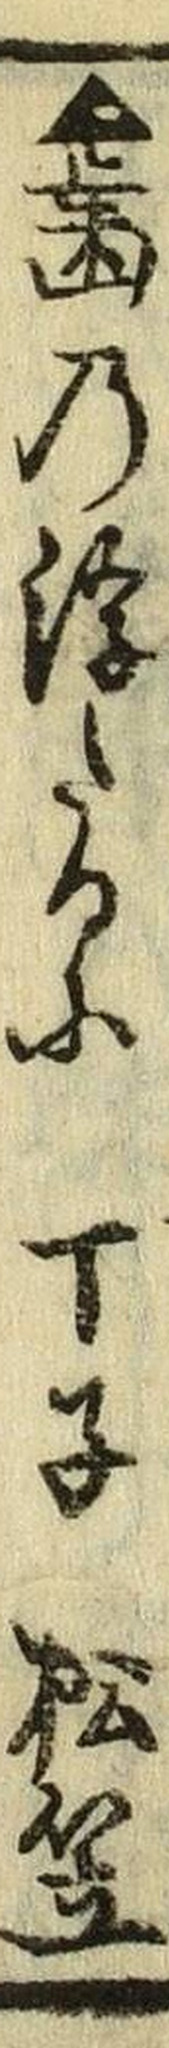▲歯の浮たるに丁子松笠
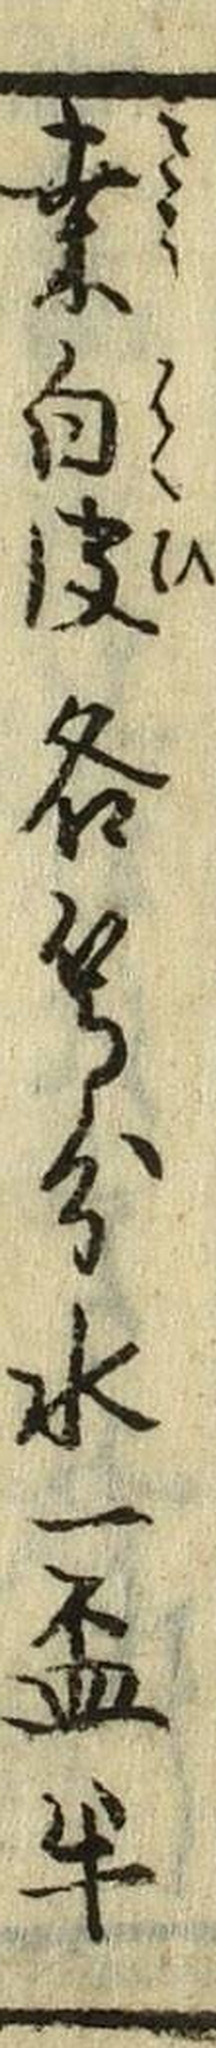桑白皮各等分水一盃半
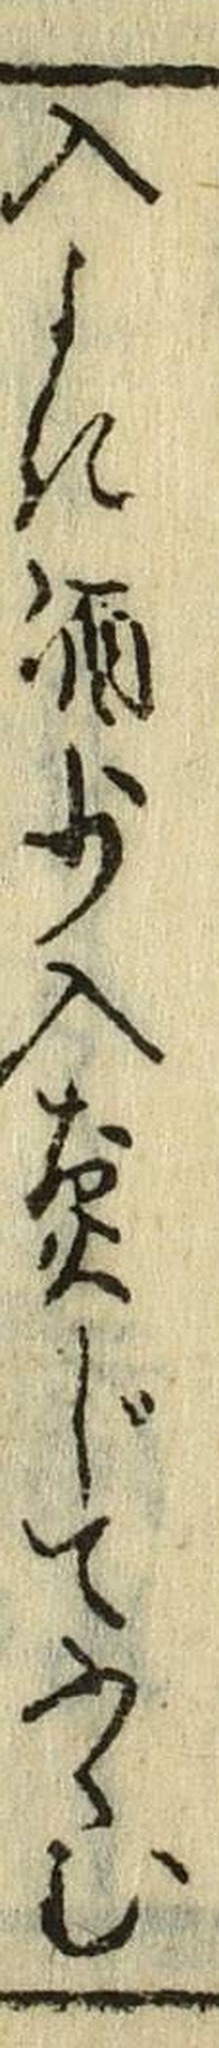入よき酒少入煎じてふくむ
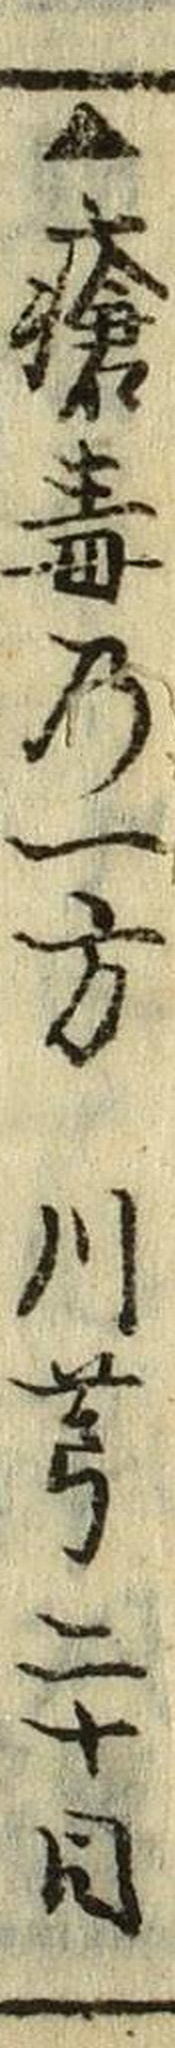▲瘡毒の一方川芎二十目
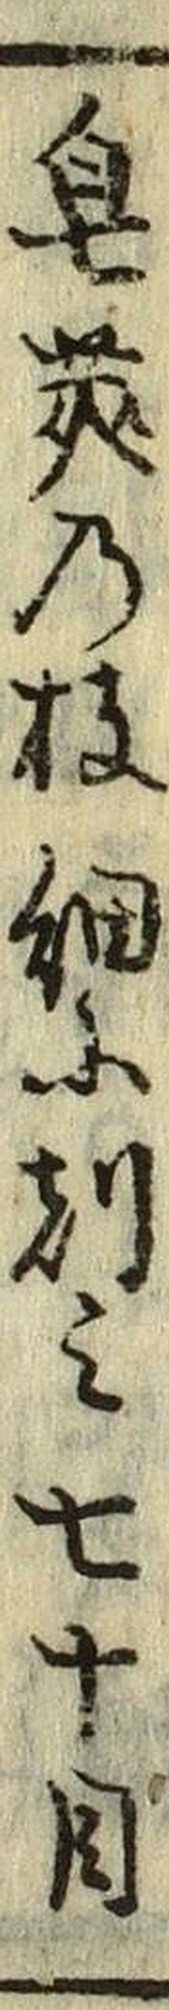皂莢の枝細に刻み七十目
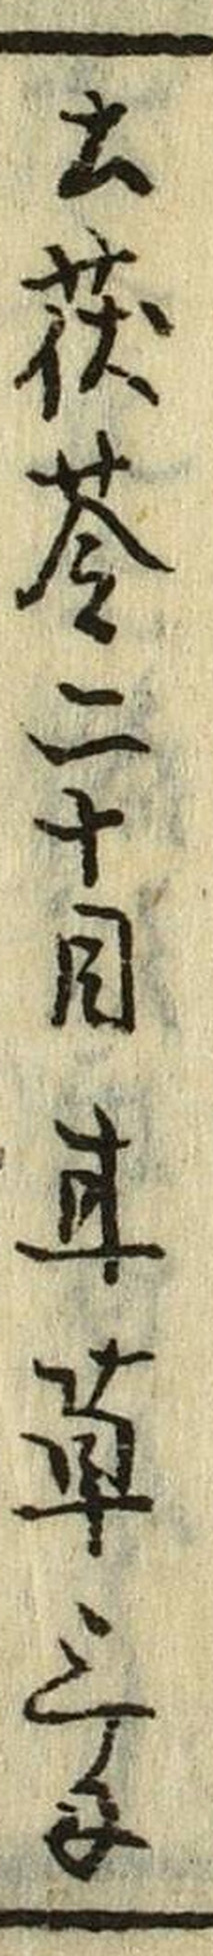土茯苓二十目甘草三匁
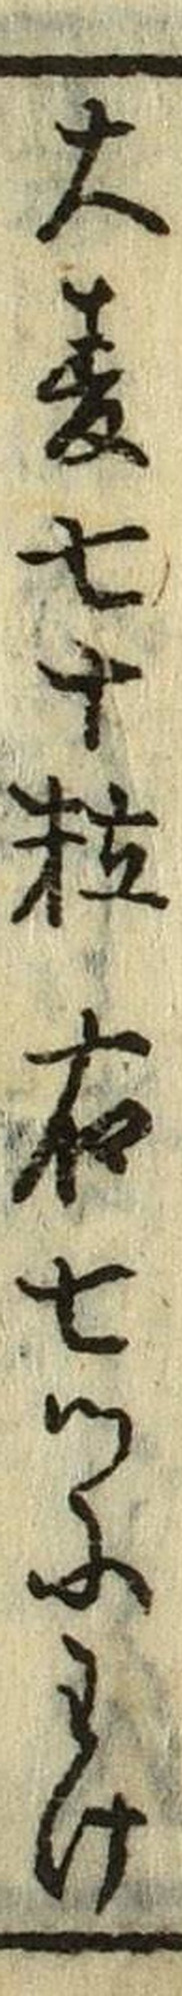大麦七十粒右七ツにわけ
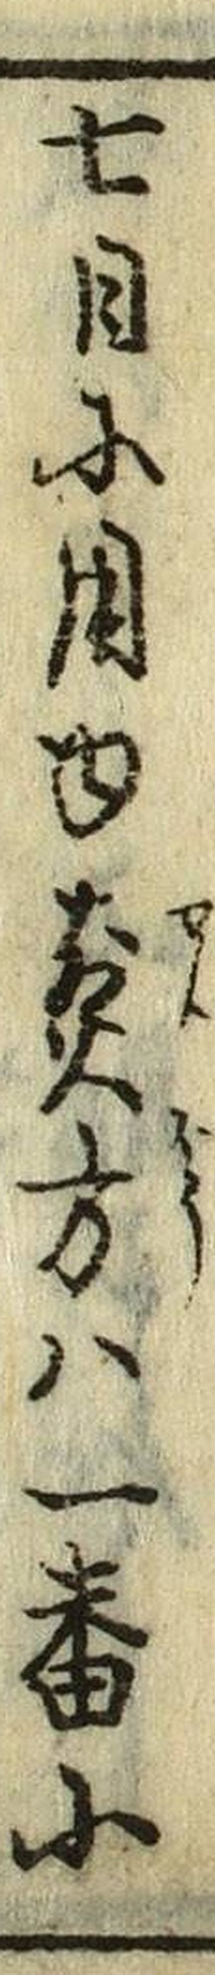七日に用ゆ煎方は一番に
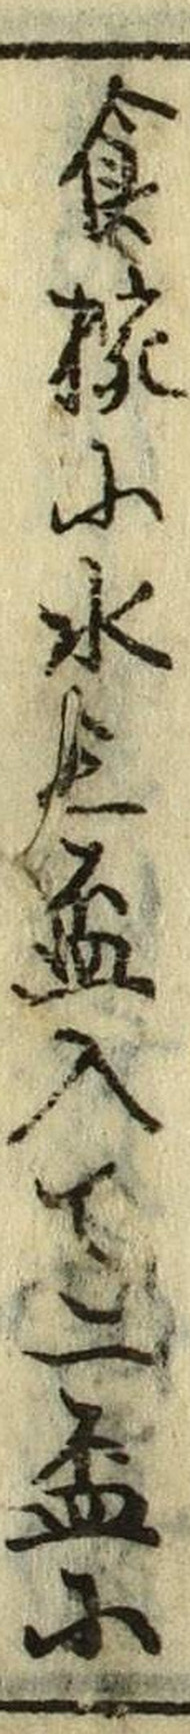食椀に水三盃入て二盃に
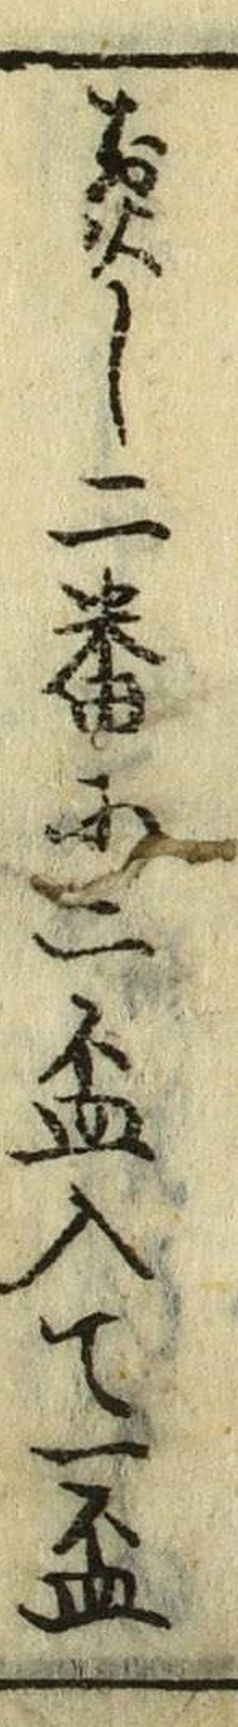煎し二番に二盃入て一盃
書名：居家養生記
